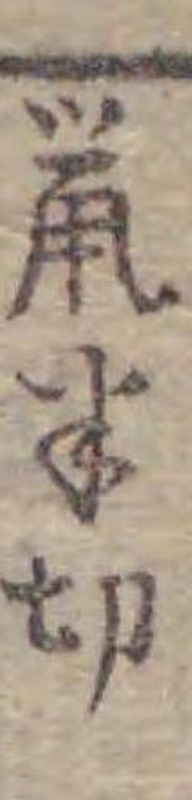鼠半切
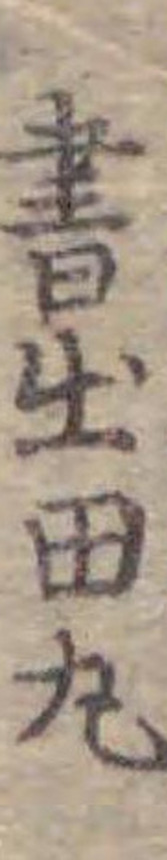書出田丸
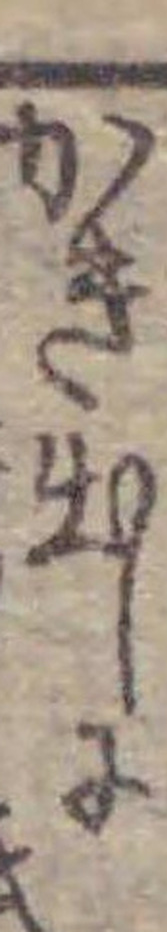かき出しに
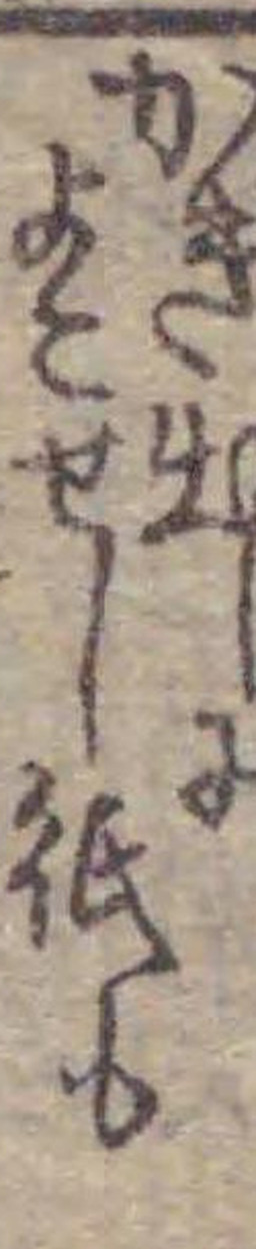よこせし紙も
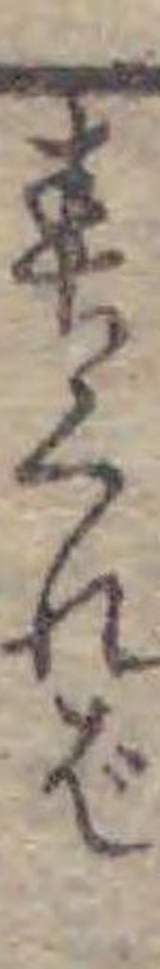春くれば
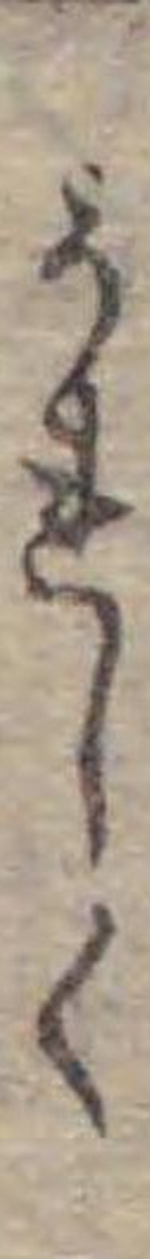うれしく
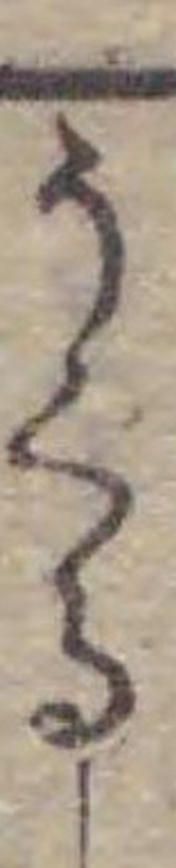うくる
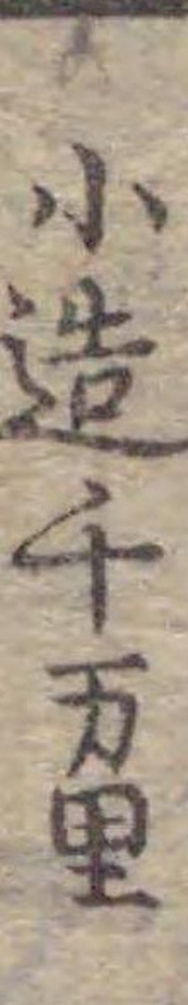小造千万里
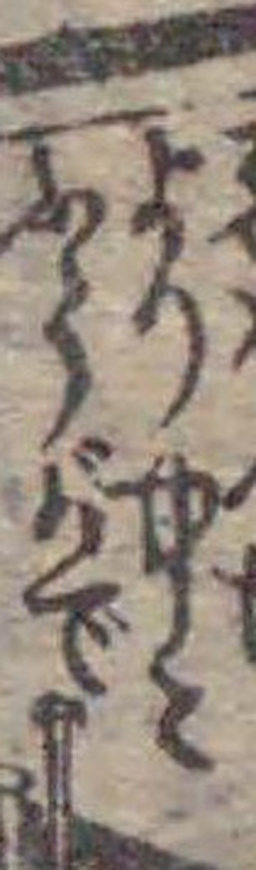ふうがで
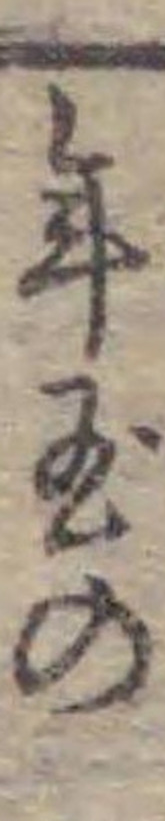年玉の
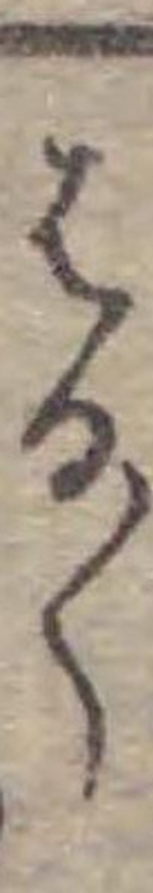はる〳〵
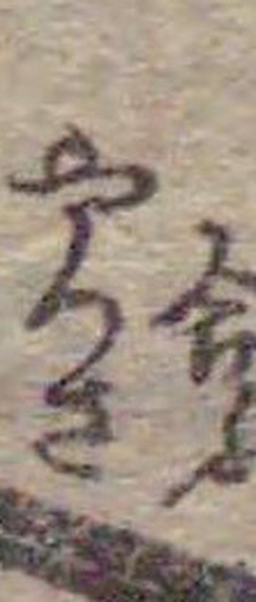やつさ
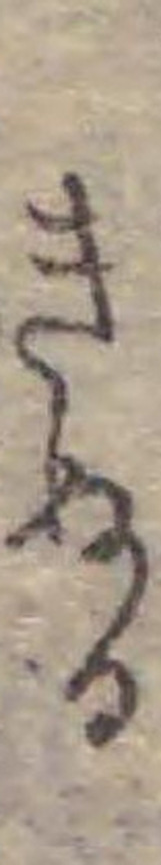きぬる
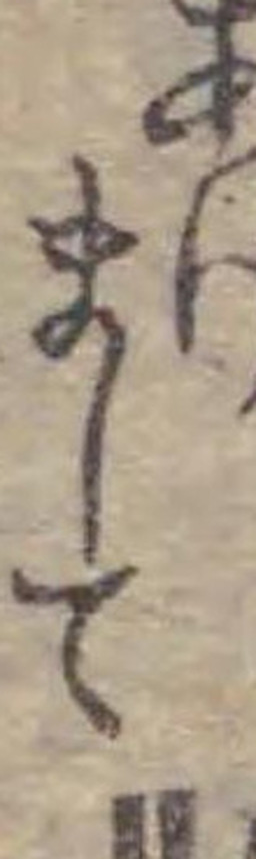まして
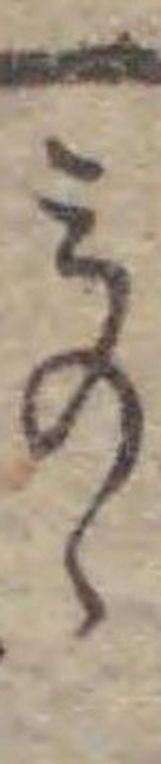みのゝ

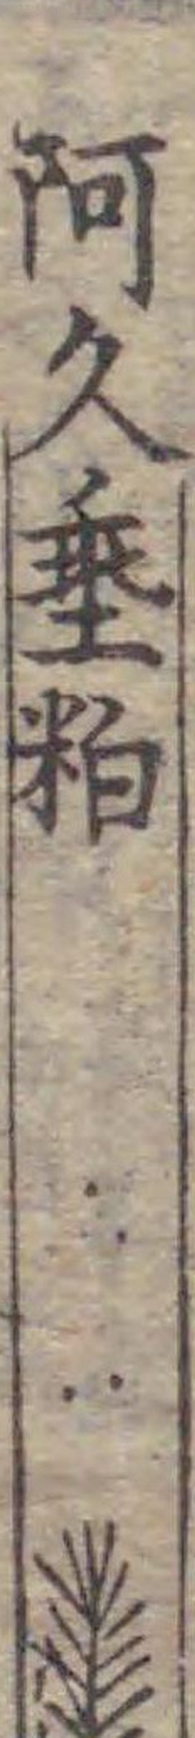阿久垂粕
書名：年始御礼帳 : 3巻
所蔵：国立国会図書館 National Diet Library, JAPAN
